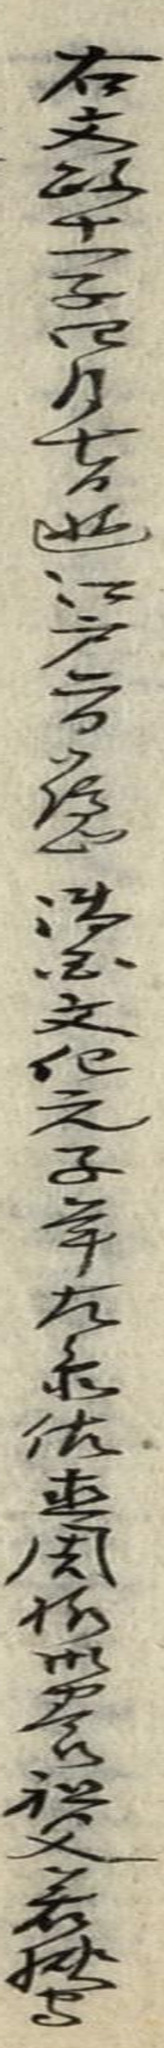右文政十一子四月十七日逝江戸二日御停止御国文化元子年左兵衛佐直周様御養祖父若狭守
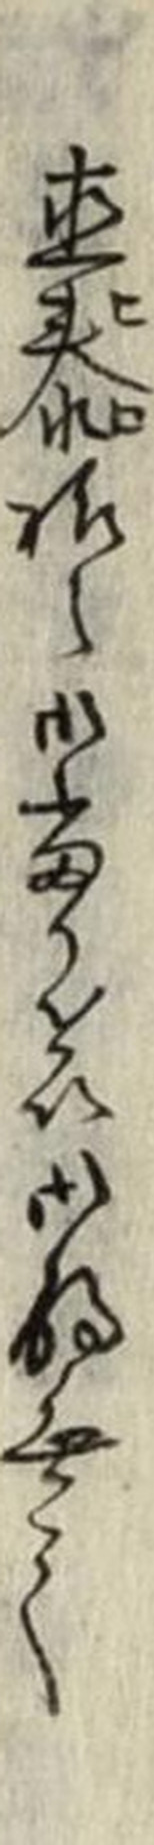直泰様之御当りを以御触無之
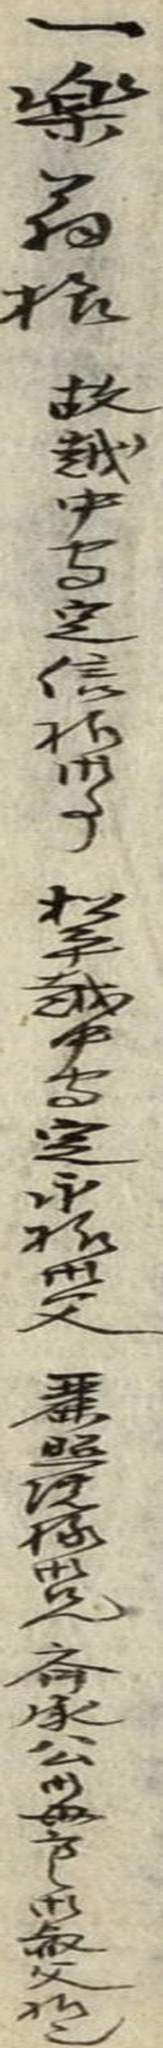一楽翁様故越中守定信様御事松平越中守定永様御父麗照院様御兄斉承公御母方之御叔父様也
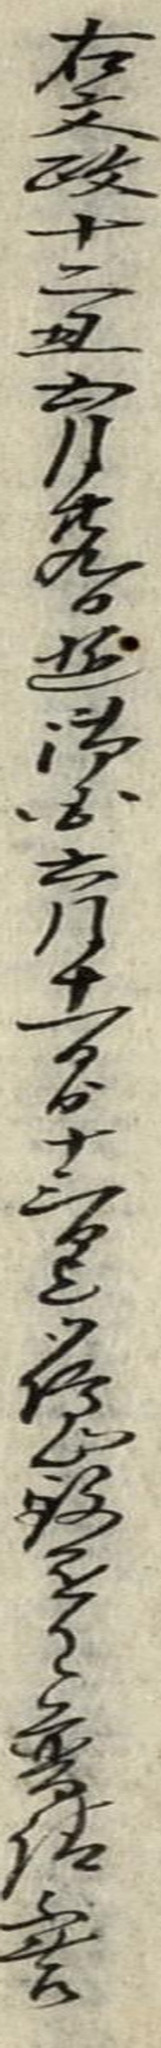右文政十二丑五月廿九日逝御国六月十一日ゟ十三日迄御停止致懸り候普請不苦
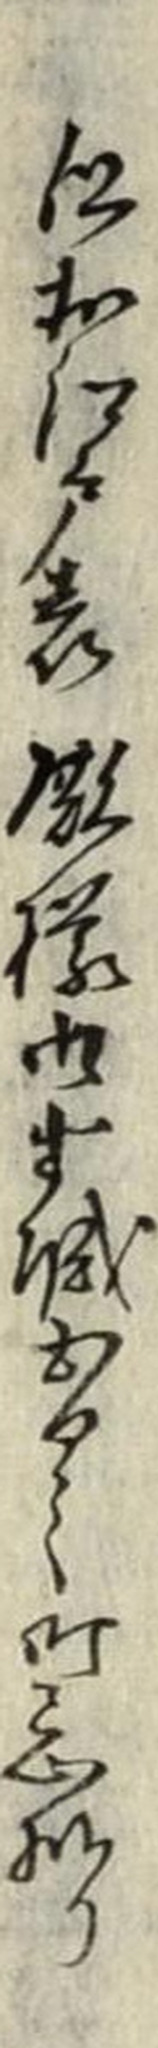但於江戸表殿様御半減五日之御忌掛り
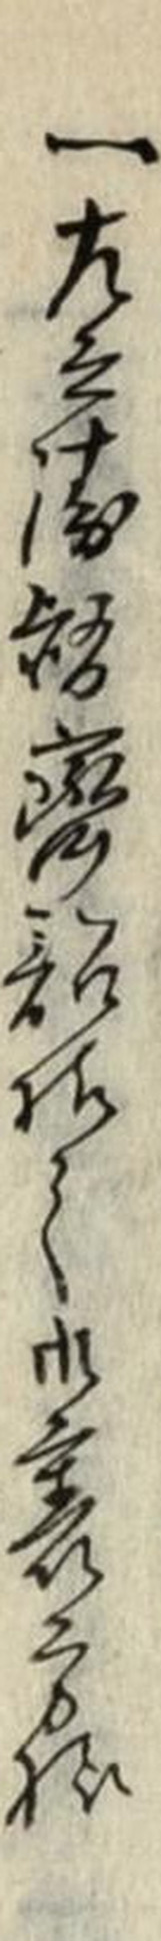一左兵衛督斉韶様之御裏方様
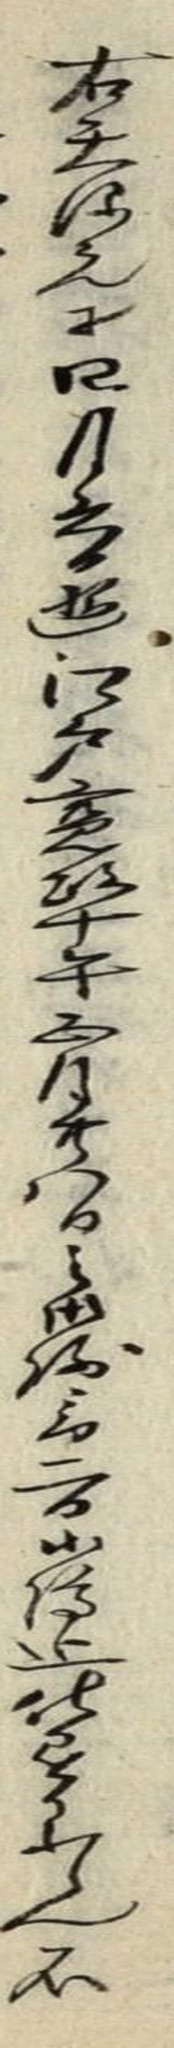右天保元刁四月六日逝江戸寛政十午正月十八日之御例にて二日御停止仕懸りふしん不
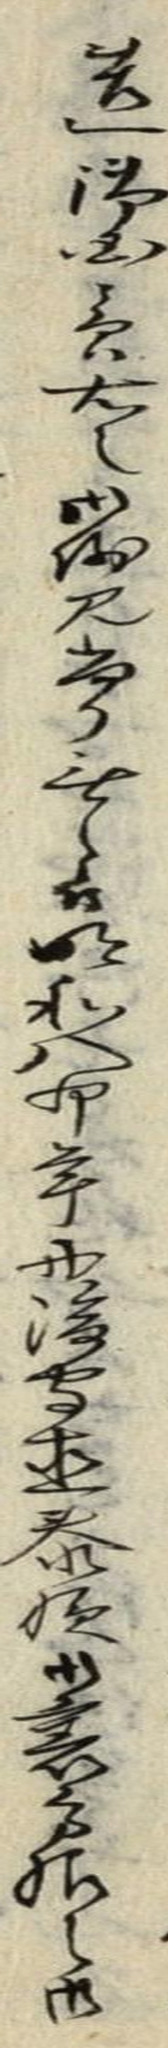苦」御国にては右之御例見当り無之に付明和八卯年丹後守直泰様御裏方様之御
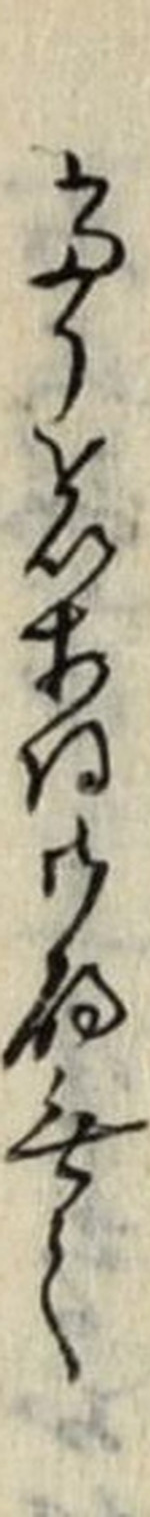当りを以相伺御触無之
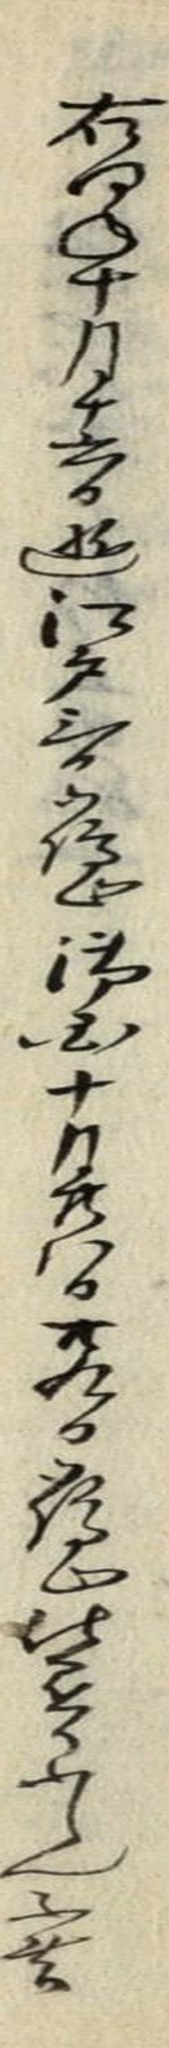右同年十月十六日逝江戸三日御停止御国十月廿八日廿九日御停止仕懸りふしん不苦
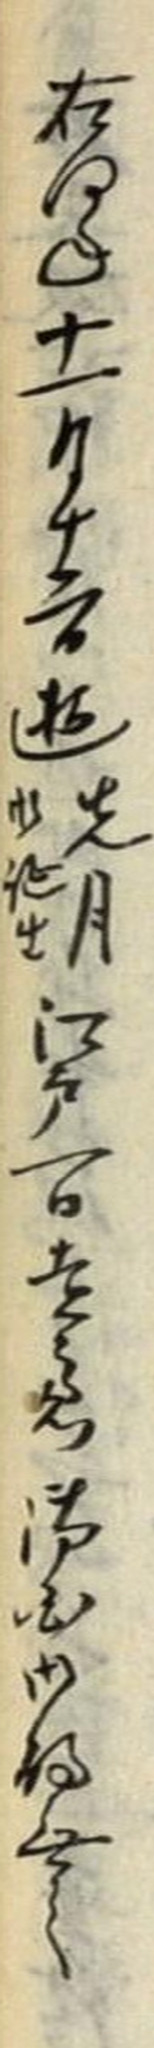右同年十一月十二日逝先月御誕生江戸一日遠慮御国御触無之
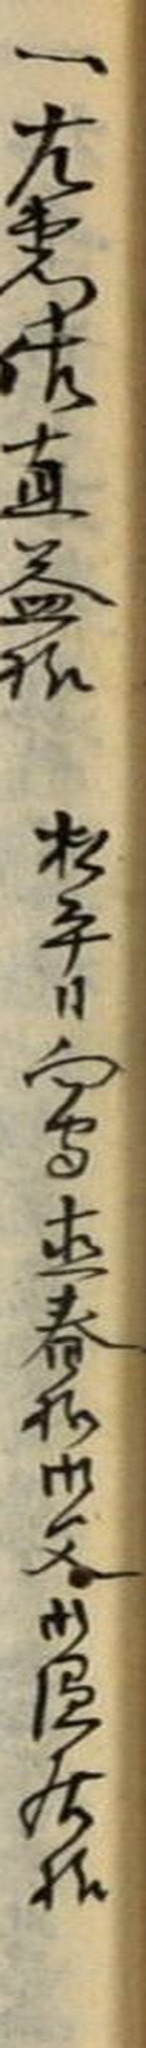一左衛門佐直益様松平日向守直春様御父御隠居様
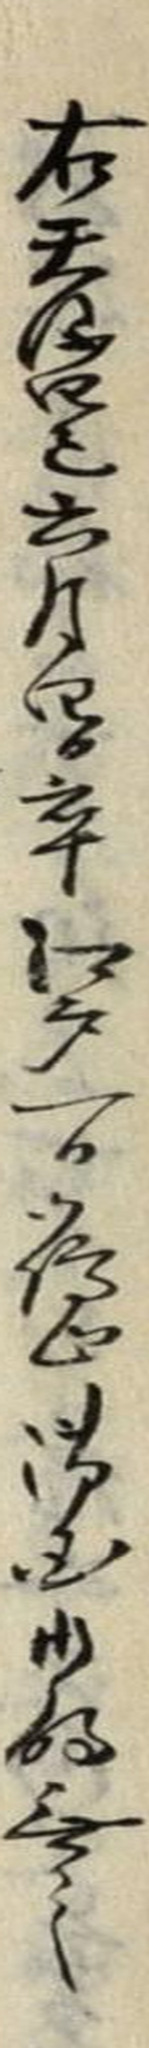右天保四巳六月四日卒江戸一日御停止御国御触無之
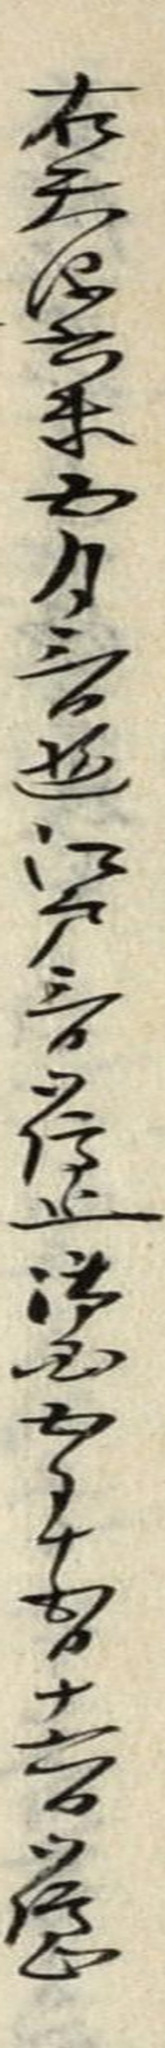右天保六未五月三日逝江戸三日御停止御国五月十五日十六日御停止
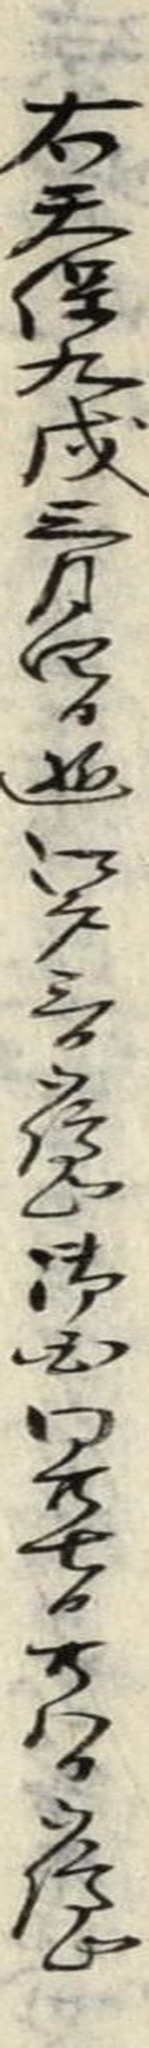右天保九戌三月四日逝江戸三日御停止御国同廿七日廿八日御停止
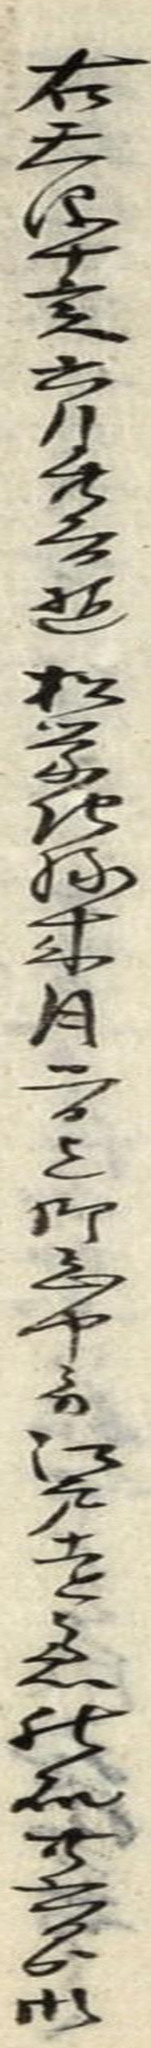右天保十亥六月廿二日逝松栄院様来月二日迄御忌中に付江戸遠慮然処廿六日ゟ御
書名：御停止異変死失
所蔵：福井県文書館 Fukui Prefectural Archives
